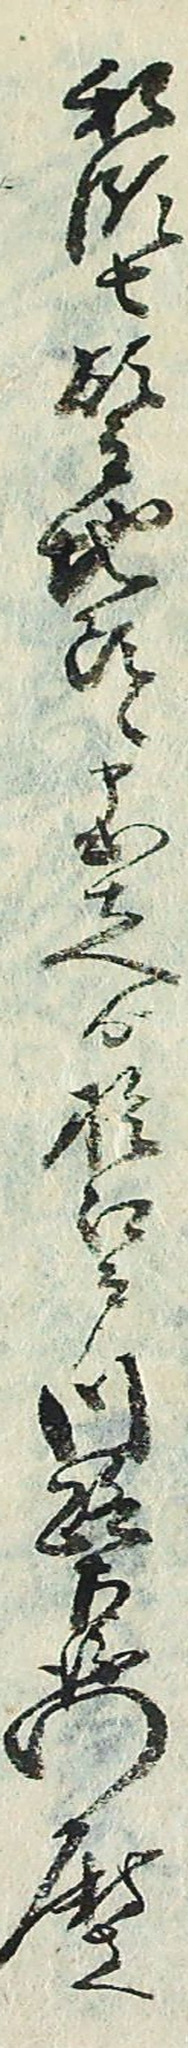私領は領主地頭へ申出夫ゟ於江戸川路左衛門尉方へ
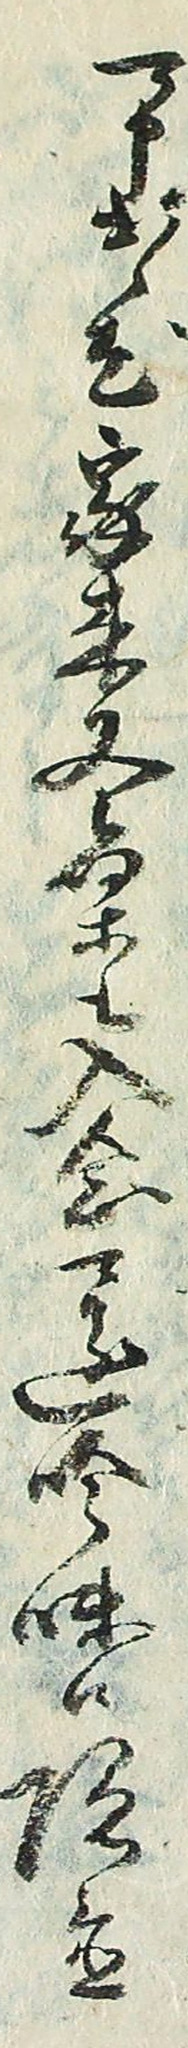可申出候尤家来又者等も入念可遂吟味隠置
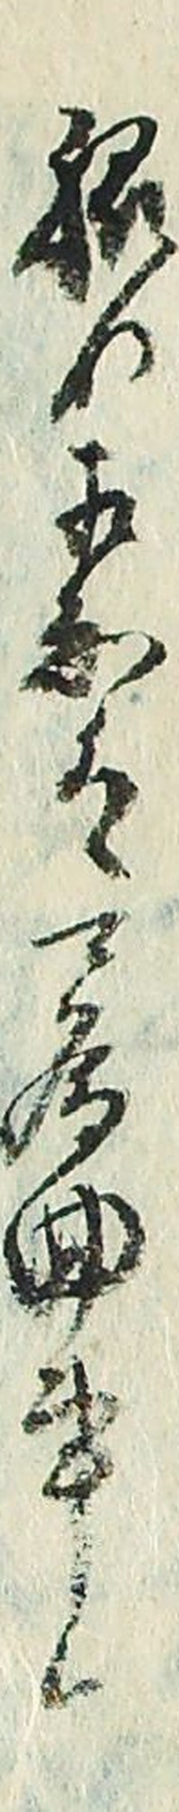脇ゟ相知候はゝ可為曲事候
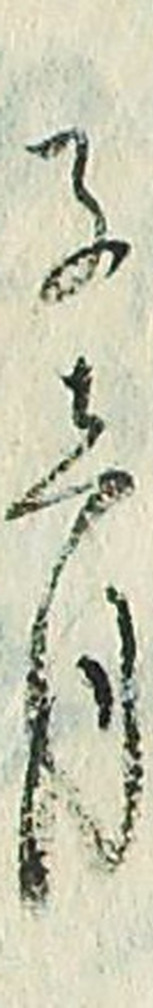子十二月
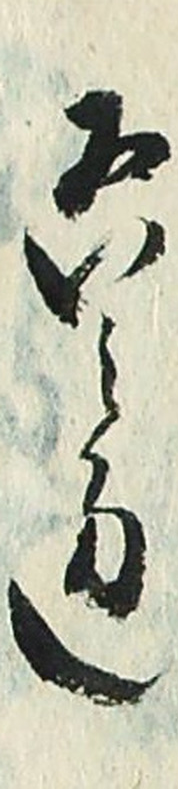右之通
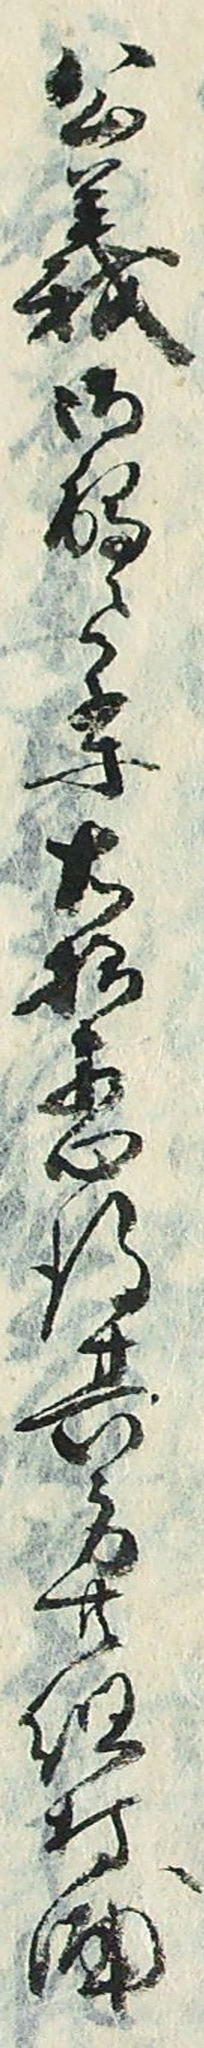公義御触に候条右様相心得其方共組村浦

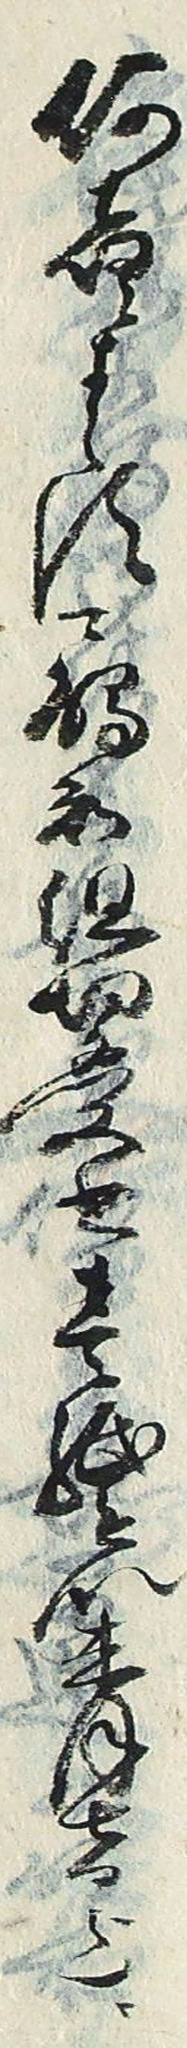何者によらす可触知組切受書壱紙を以来月七日迄に
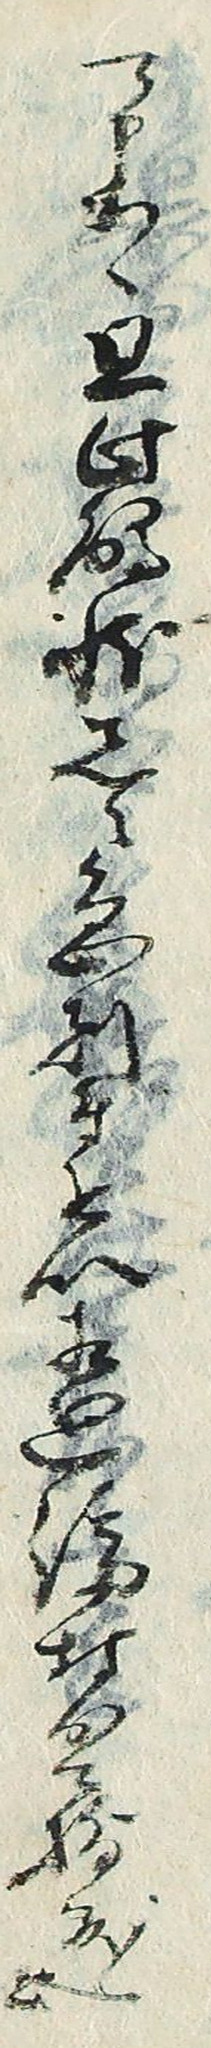可申出候此触状先々急刻付を以相廻済村ゟ可指戻候以上
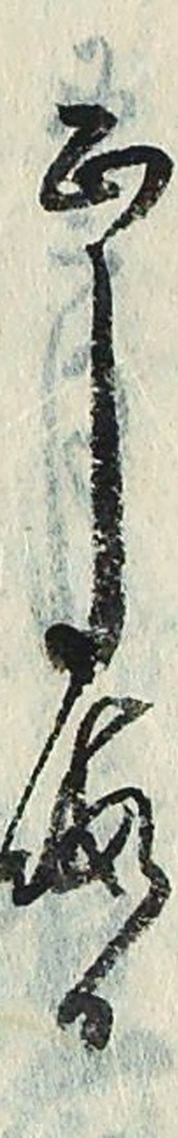正月晦日
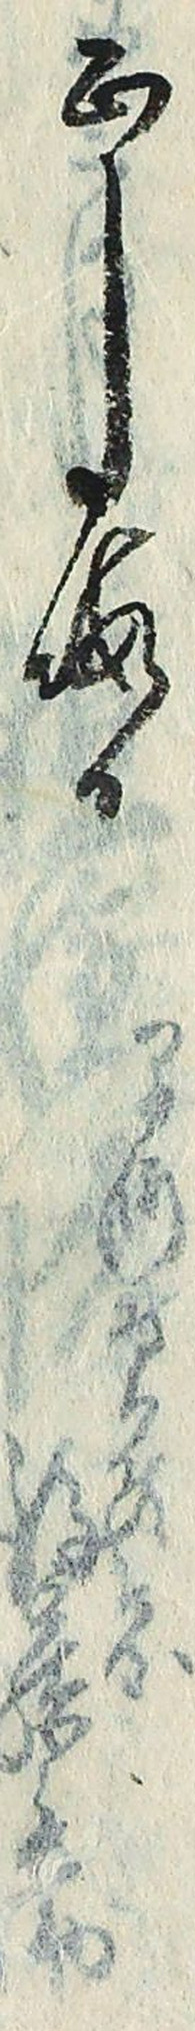正月晦日
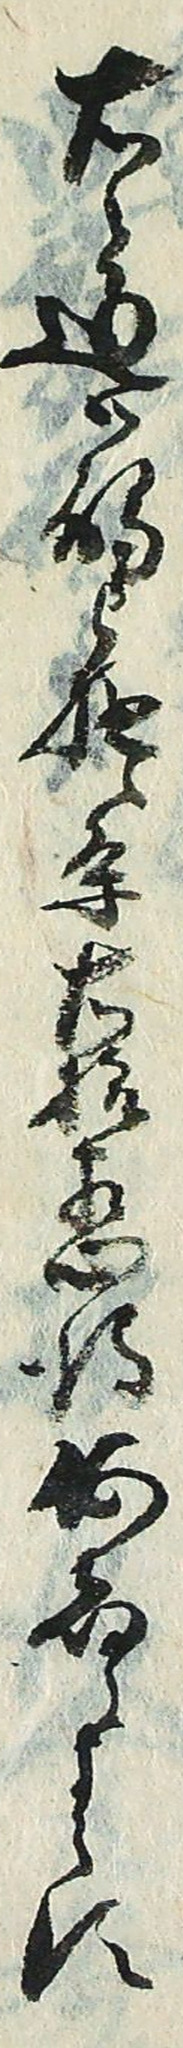右之通御触被遊候条右様相心得何者によらす
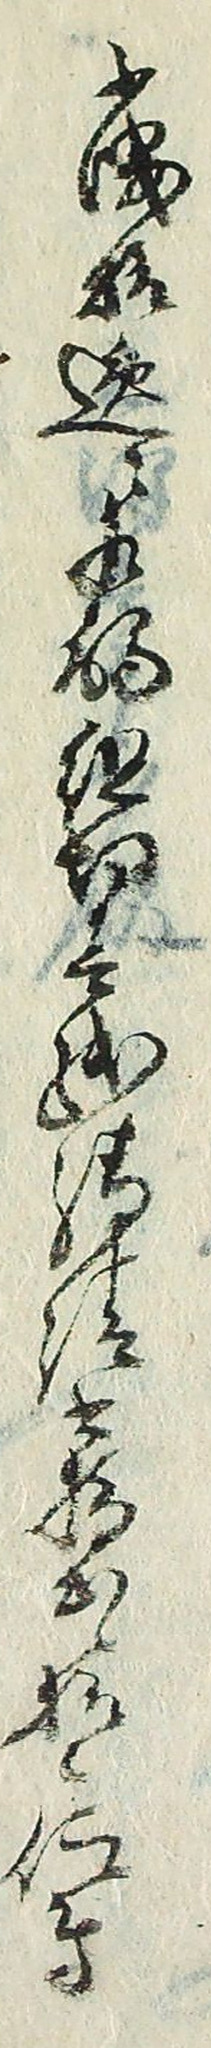不洩様逸々相触組切壱紙請書指出候様被仰付
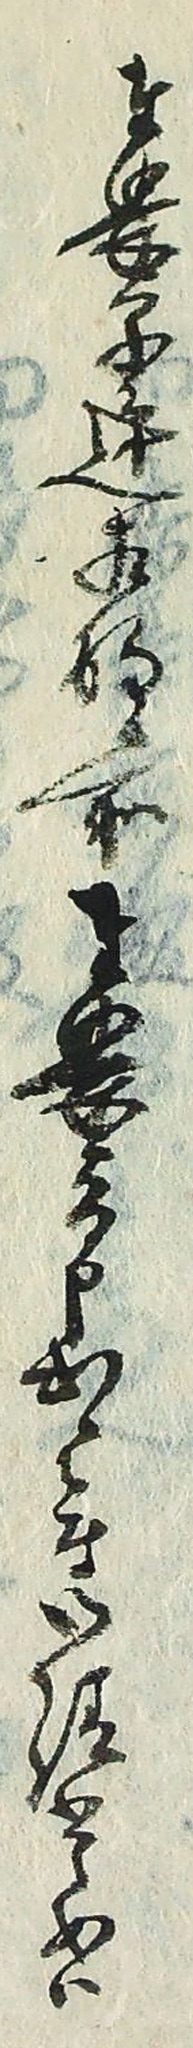奉畏早速相触候所奉畏旨申出候に付御請書之義は
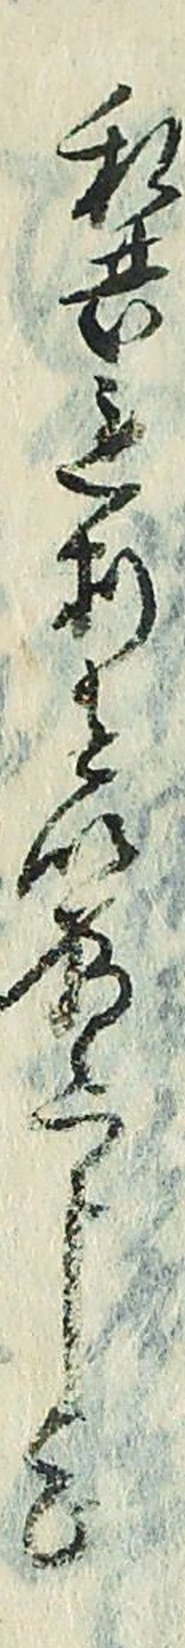私共連判を以指上申候以上
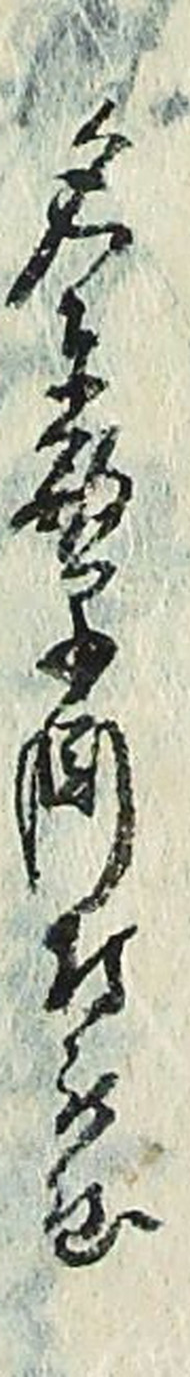名東郡早淵村庄屋
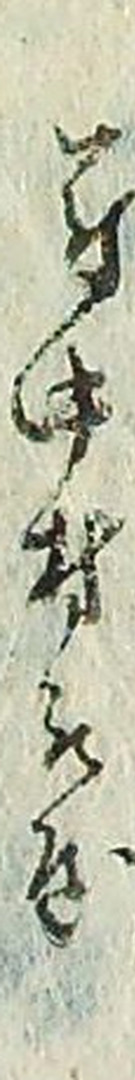府中村庄屋
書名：諸御用御□受書控
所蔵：鳴門教育大学 Naruto University of Education
